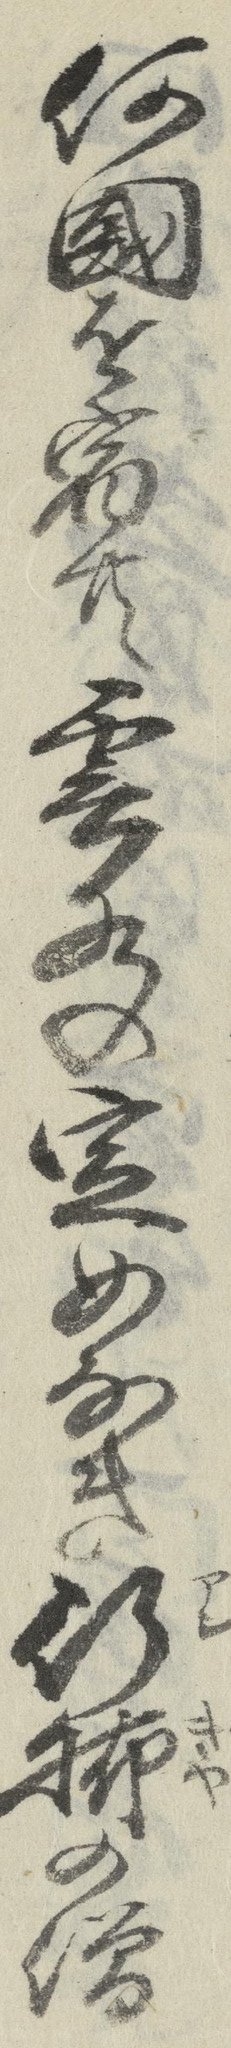何国を宿共雲水の定めなき行脚の僧
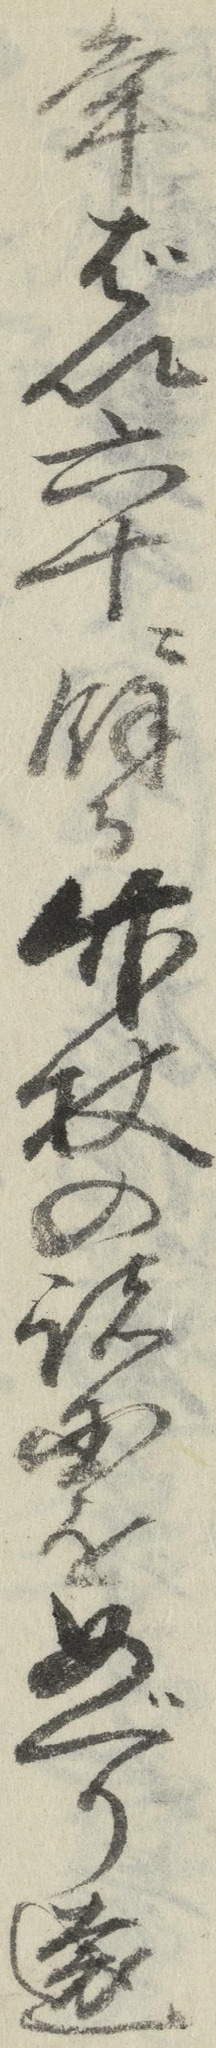年ばい六十餘る竹杖の諸国をめぐり遠
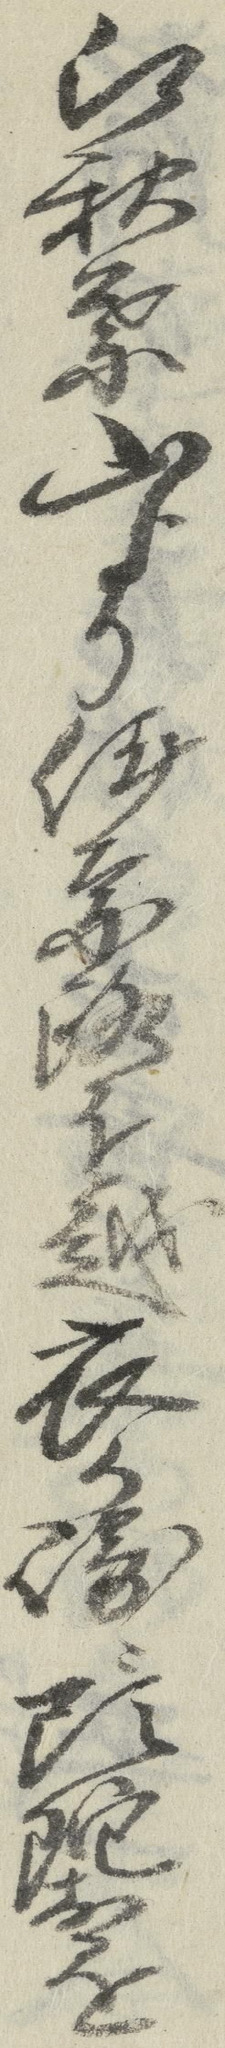江秋葉山より伊奈路を越衣か崎に頭陀なるを
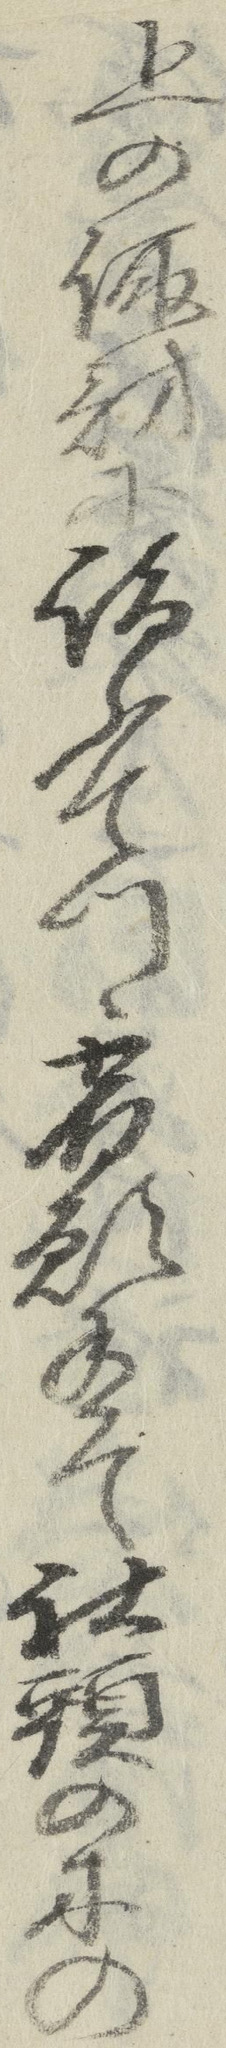上の諏訪に仰ふて内々者願有て社頭の木の
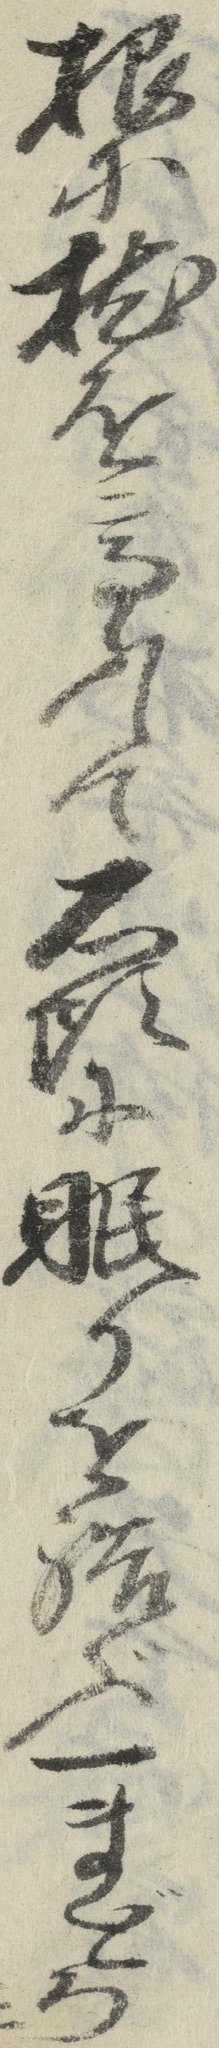根に枕を高ふして石頭に眠りを結ぶ一まどろみ

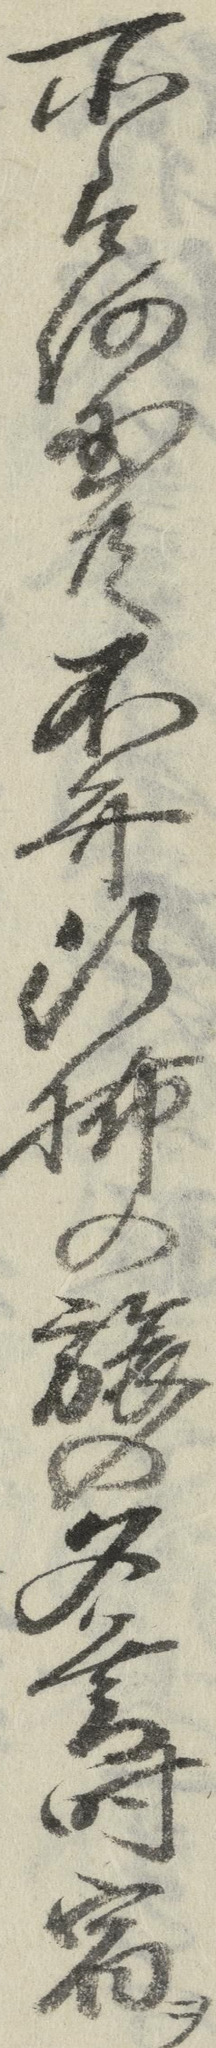所は何国共不弁行脚の旅の夕暮時宿
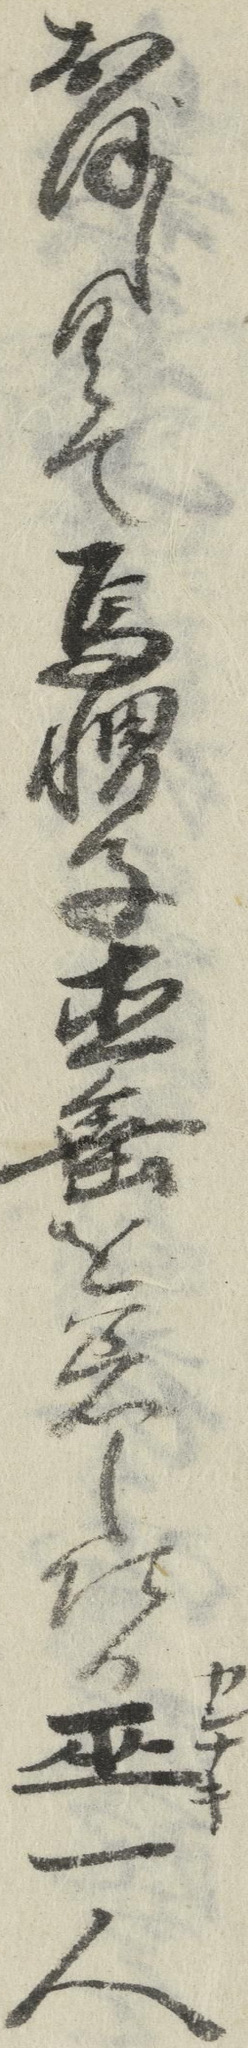おほしくて烏帽子直垂を着したる巫一人
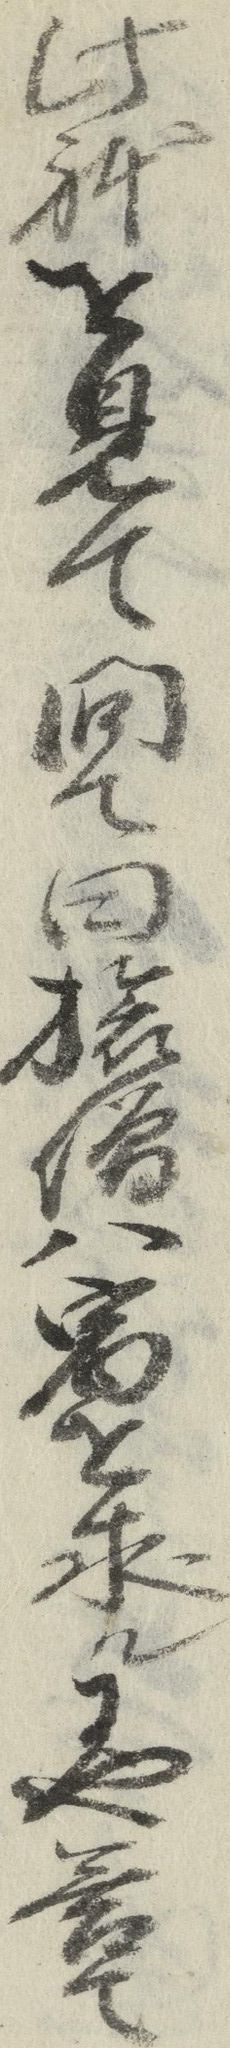此躰を見て問て曰旅僧は宿を求ルにや答て
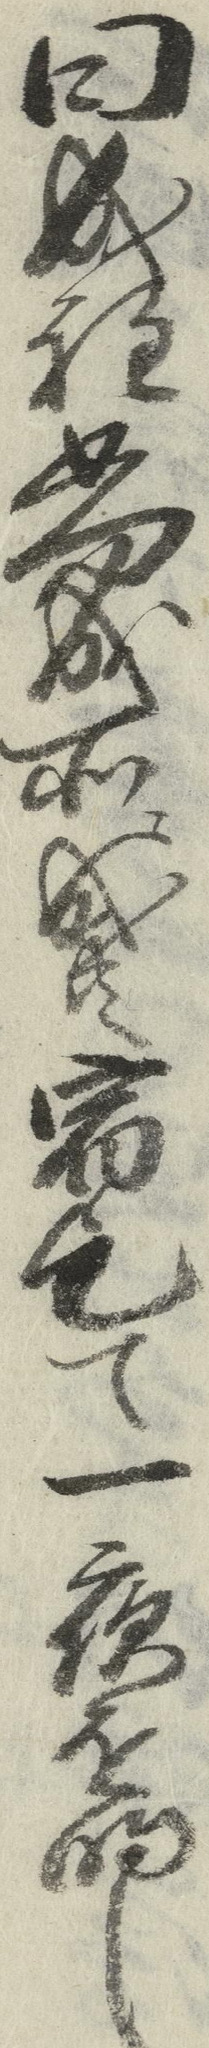曰成程如何成所に成共宿乞て一夜を明し
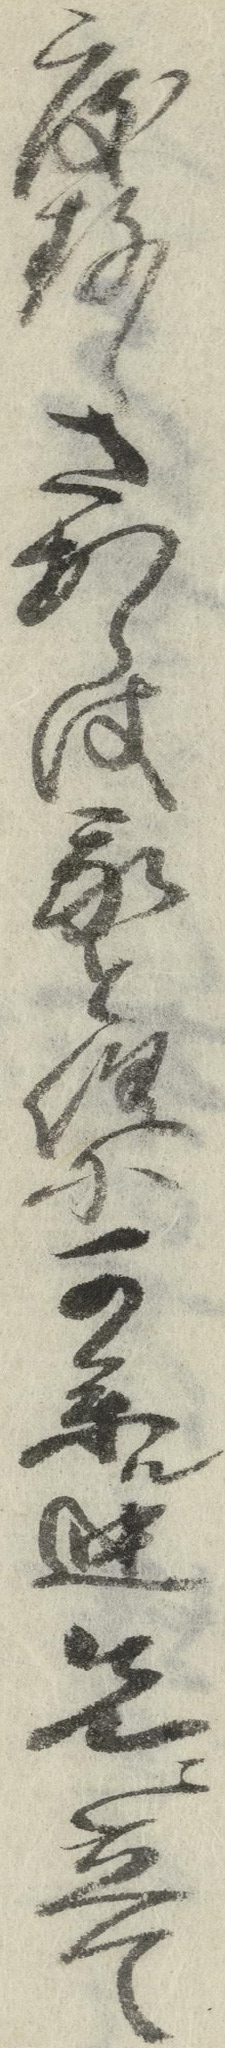度存しさあらは我と倶に可参迚先に立て
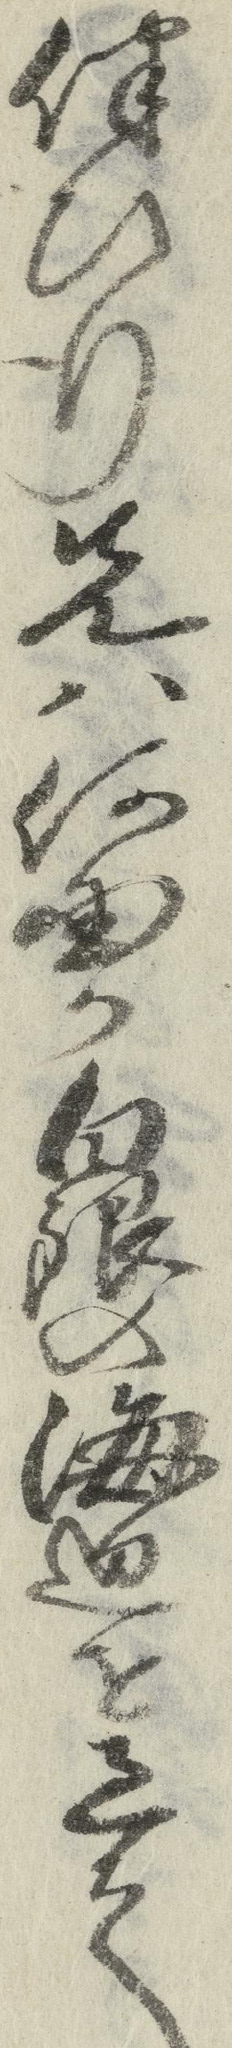伴ひ行先は何由か白銀之海辺を過て
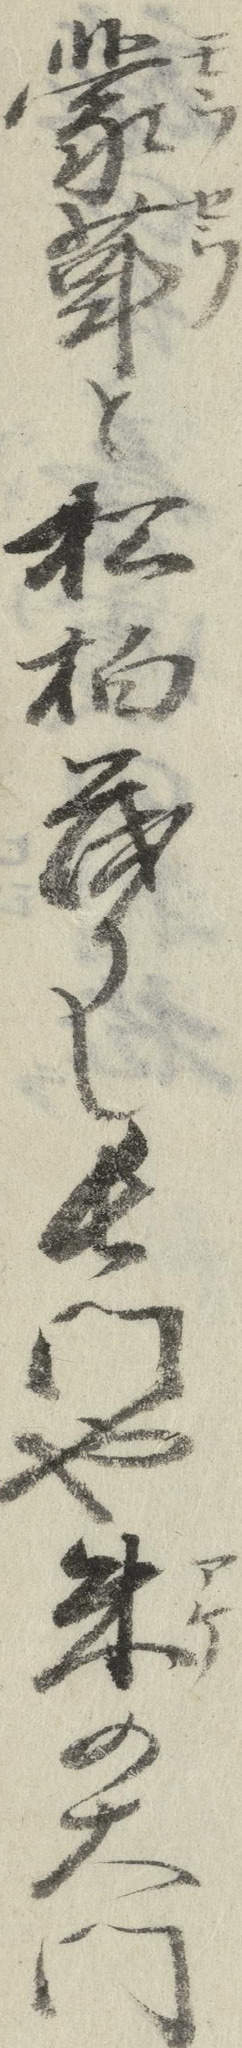蒙葦と松柏茂りし長門や朱の大門
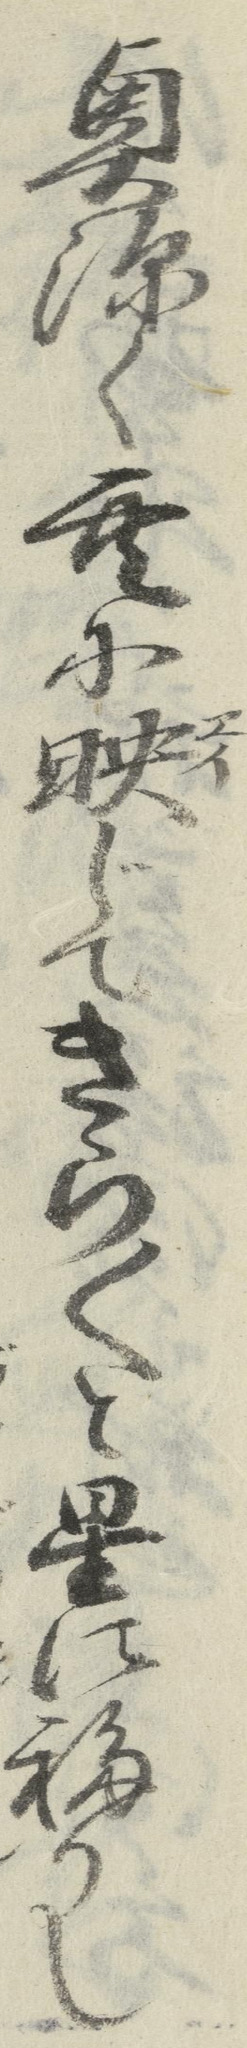奥深く空に映じてきら〳〵と星の移りし
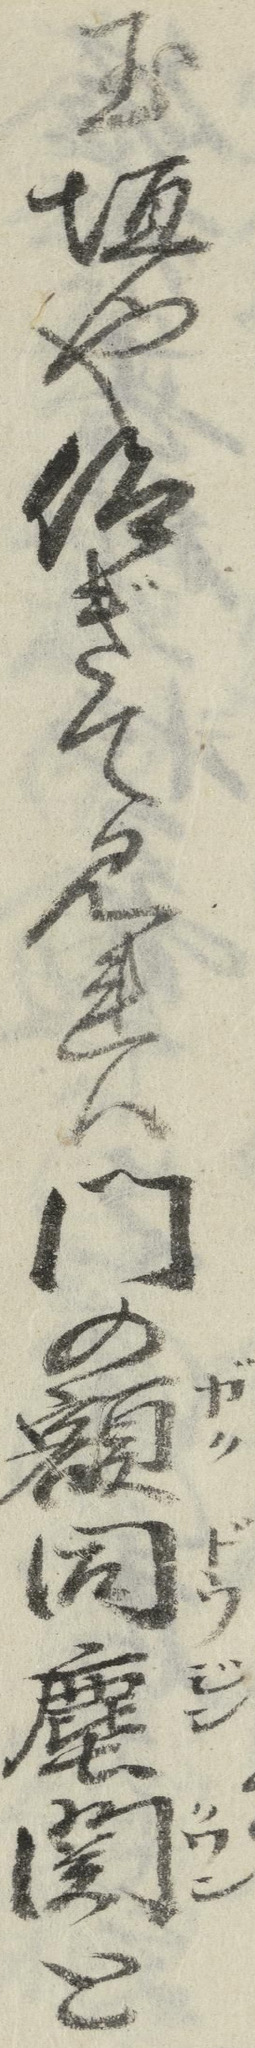玉垣や仰ぎて見れは門の額同塵関と
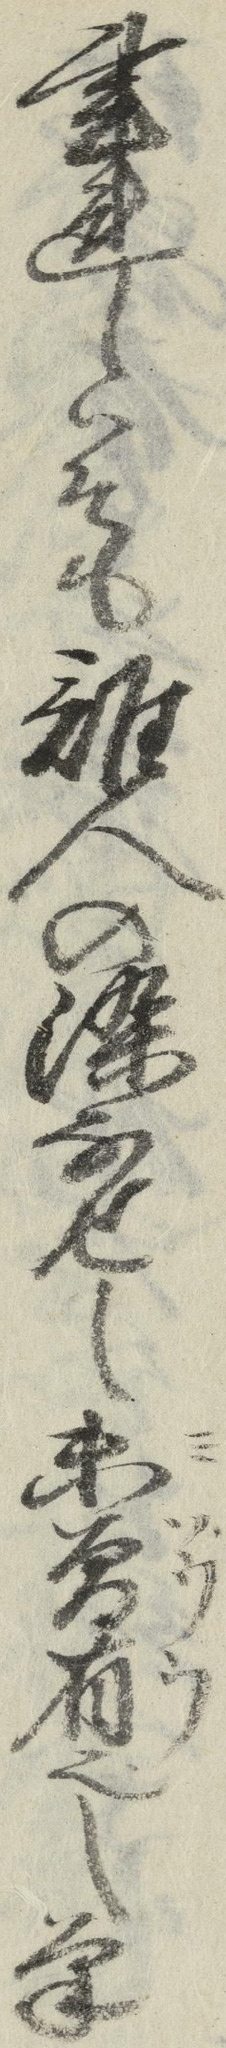書れしはそも誰人の染なせし未曽有也し筆
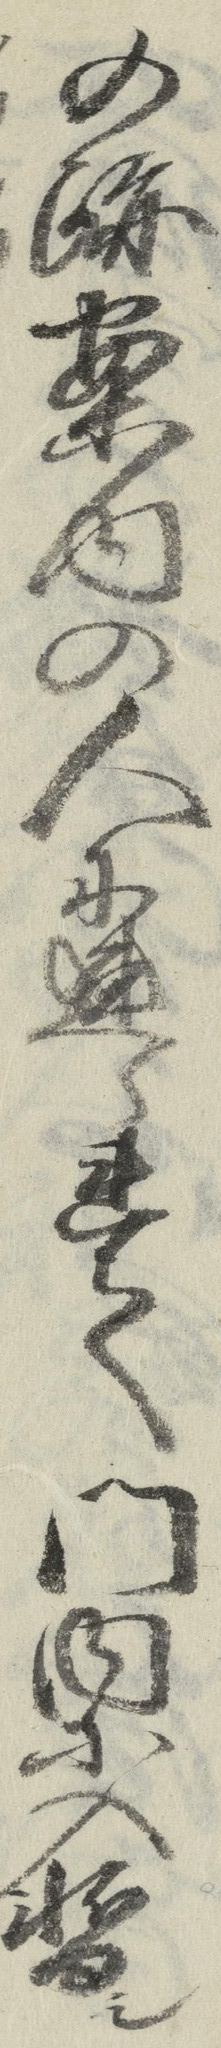の跡案内の人に連られて門内に入暫
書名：浅間大焼騒動記　上
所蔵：東京大学地震研究所図書室 Earthquake Research Institute Library, The University of Tokyo, JAPAN
